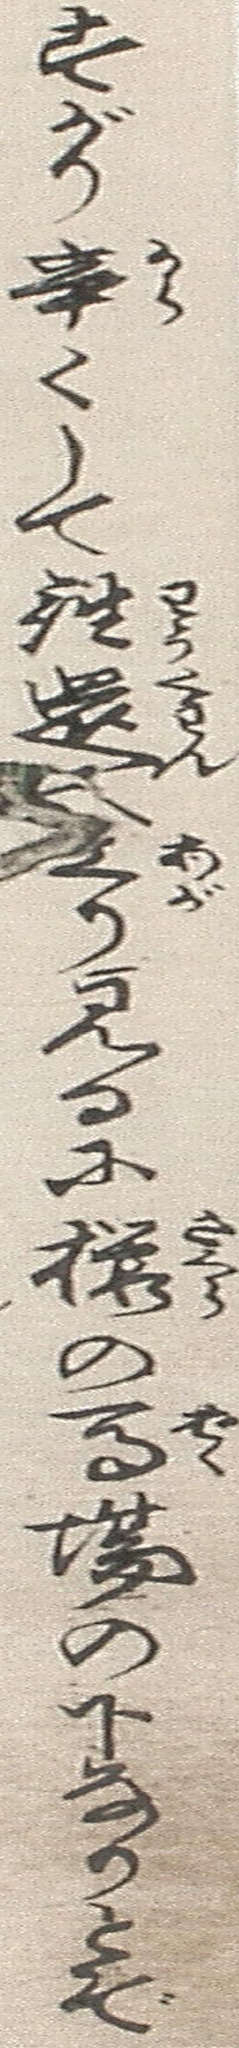すがり辛くして往還へ上り見るに桜の馬場の下なりとぞ
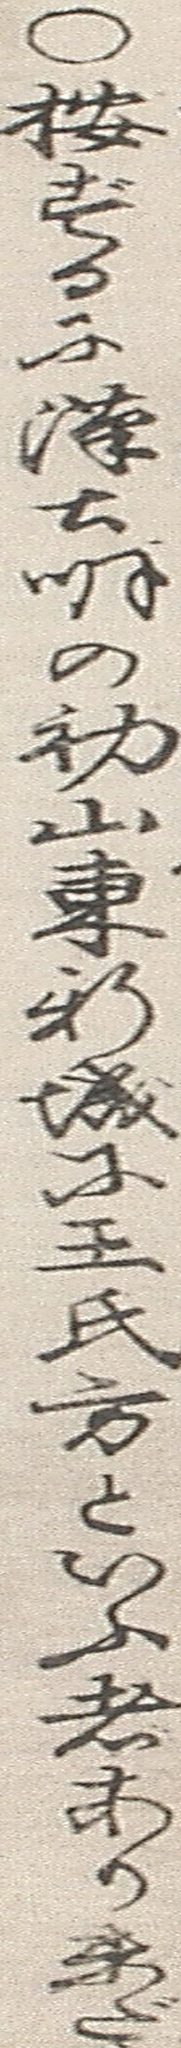◯按ずるに漢土明の初山東新城に王氏方といふ者あり未だ
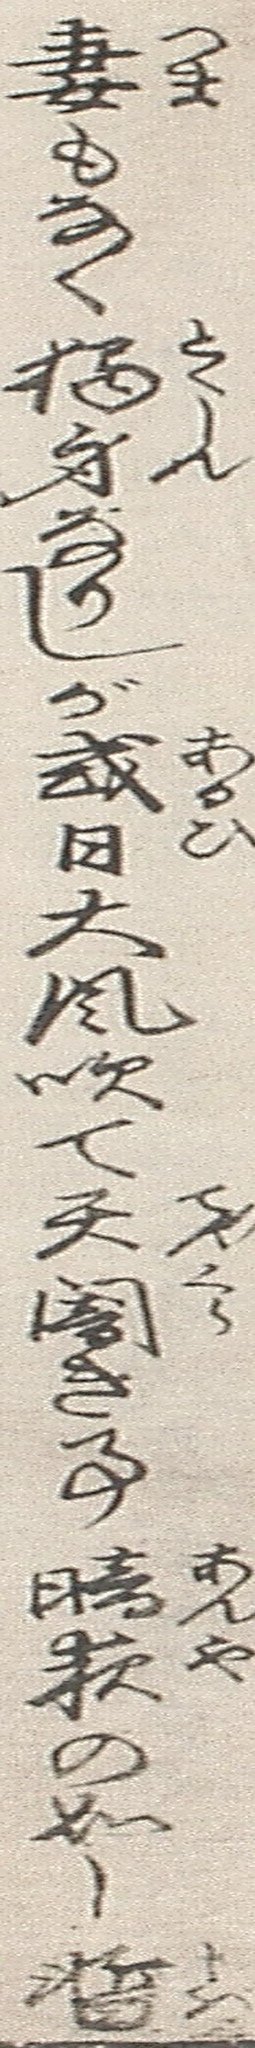妻もなく独身なりしが或日大風吹て天闇き事暗夜の如し暫
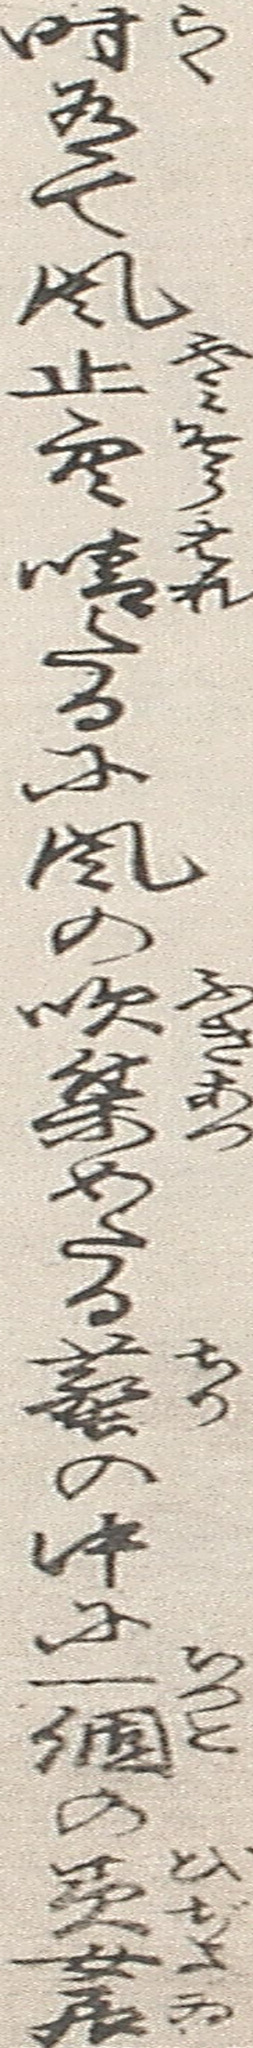時有て風止空晴れたるに風の吹集めたる塵の中に一個の夷女居
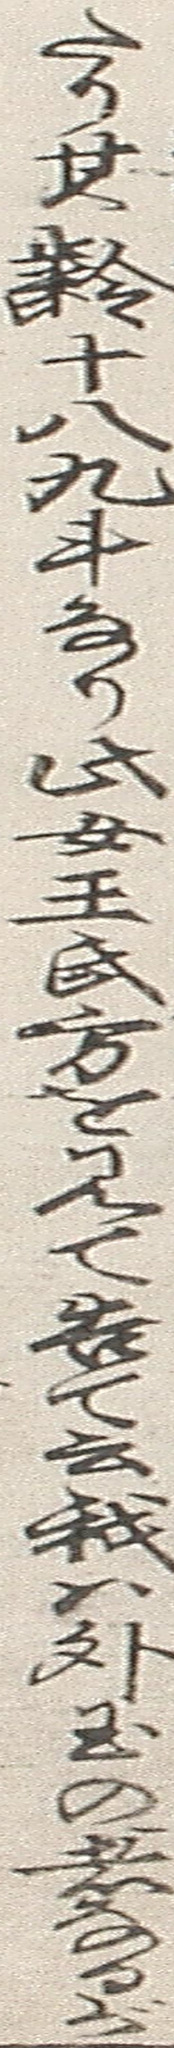たり其齢十八九斗なり此女王氏方を見て告て云我ハが外国の者なるが
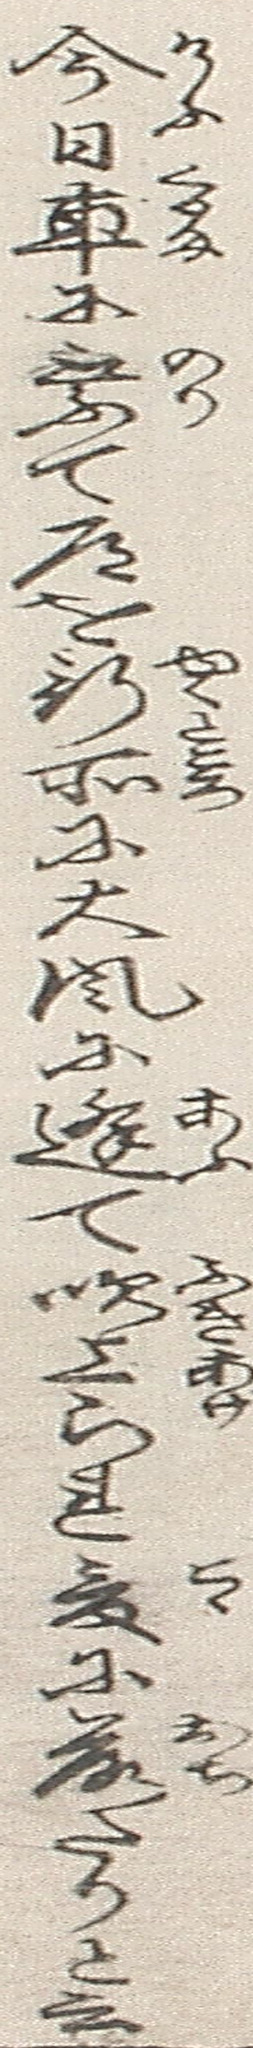今日車に乗て道を行所に大雨に逢て吹上られ爰に落たりと云
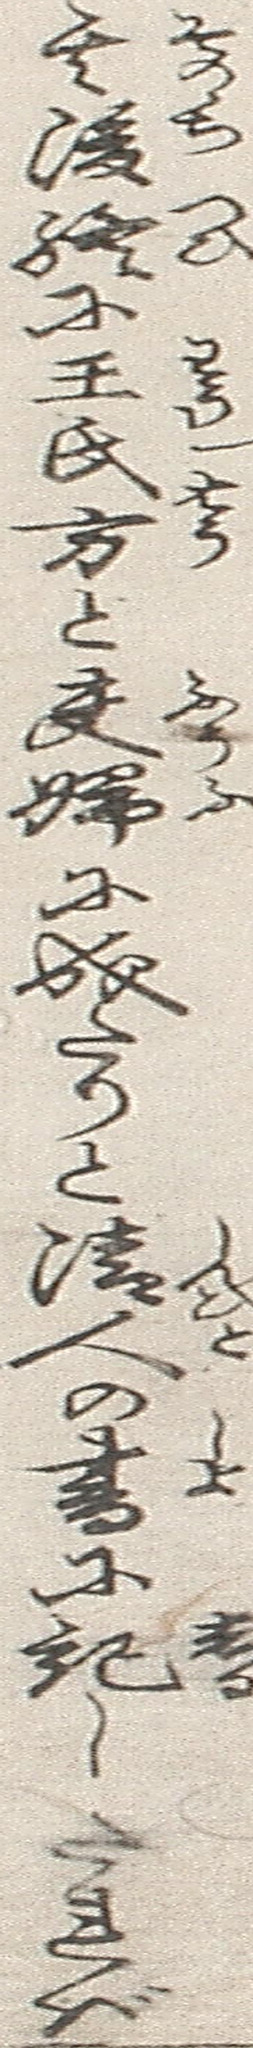其後終に王氏方と夫婦に成たりと清人の書に紀したれ
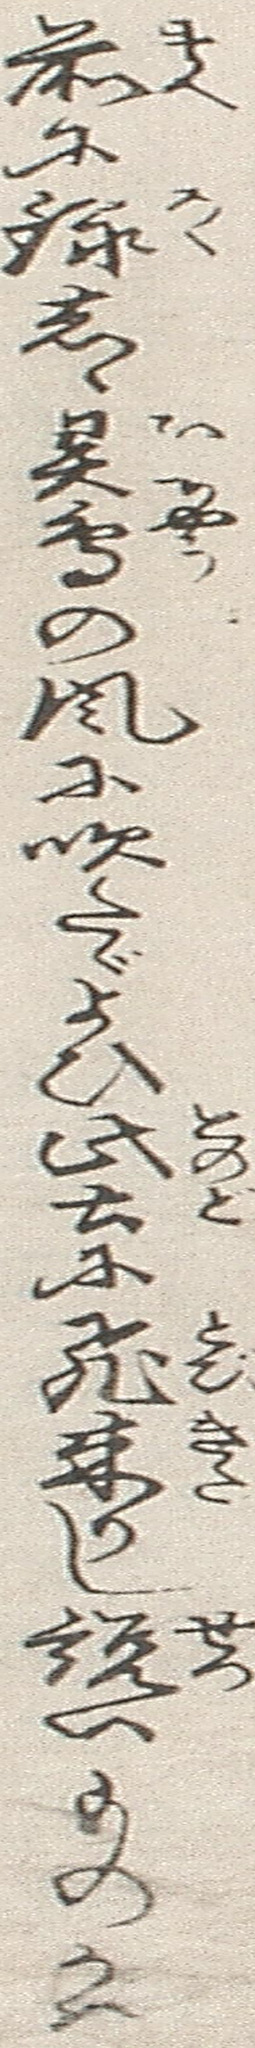前に録しゝ異鳥の風に吹たゞよひ此土に飛来りし説ハものかハ
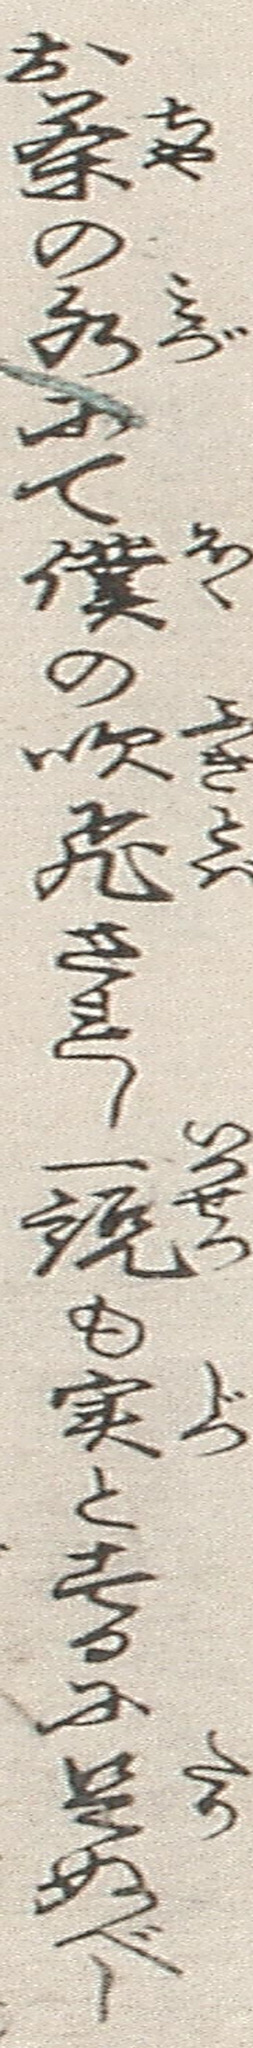お茶の水にて僕の吹飛されし一説も実とするに足ぬべし
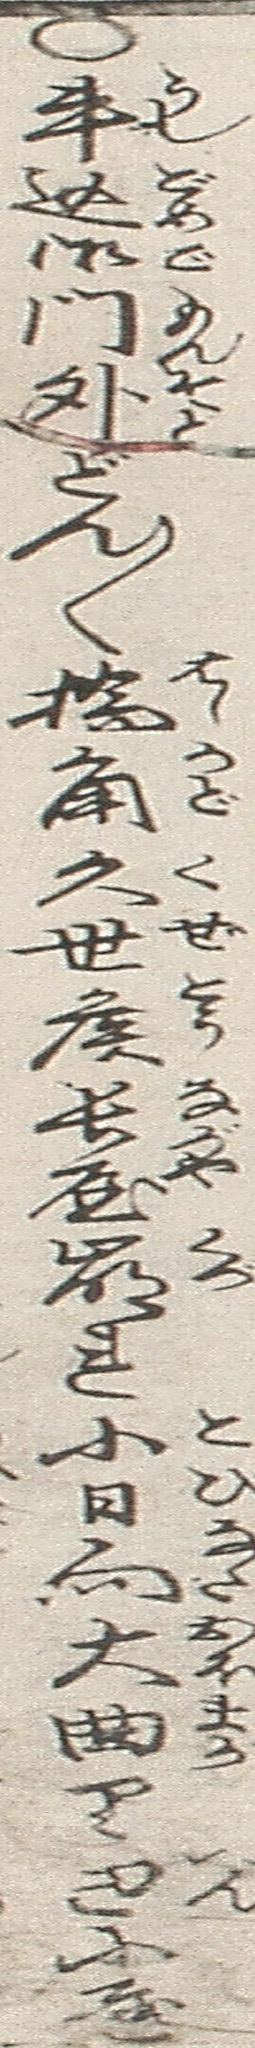◯牛込御門外どん〳〵橋角久世矦長屋崩れ小日向大曲り辺小屋

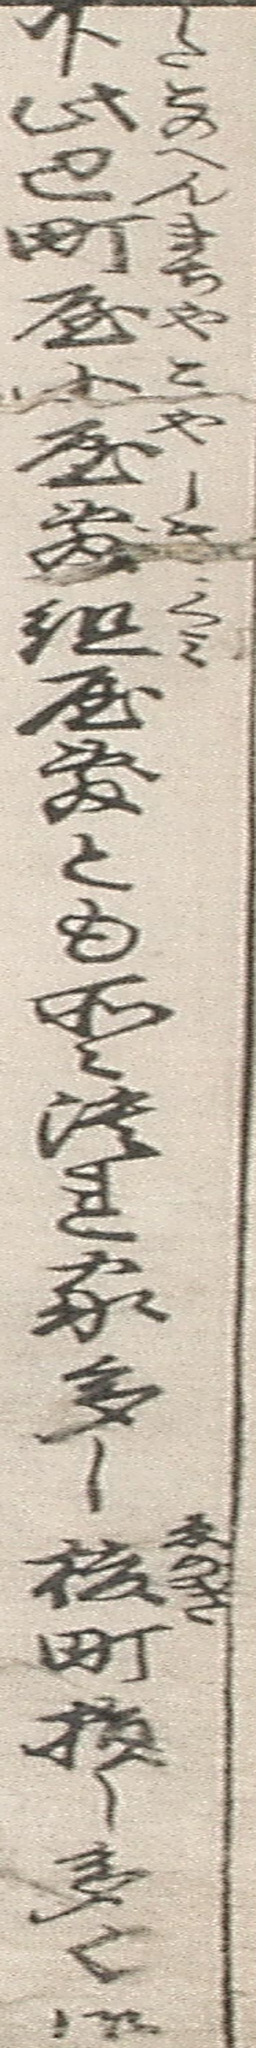下此辺町屋小屋敷組屋敷とも所々潰家多し榎町損し多し御
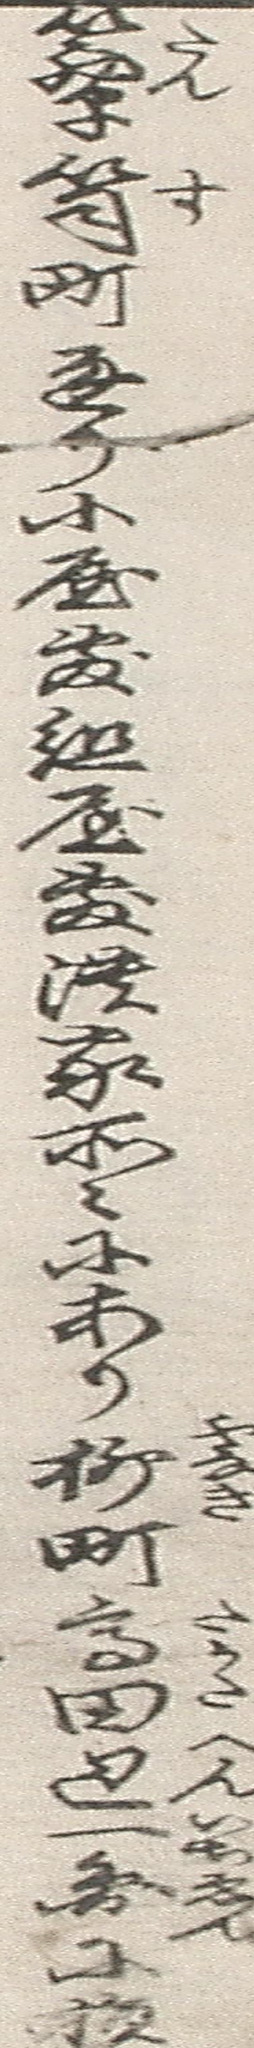箪笥町通り小屋敷組屋敷潰家所々にあり柳町高田辺一円に損
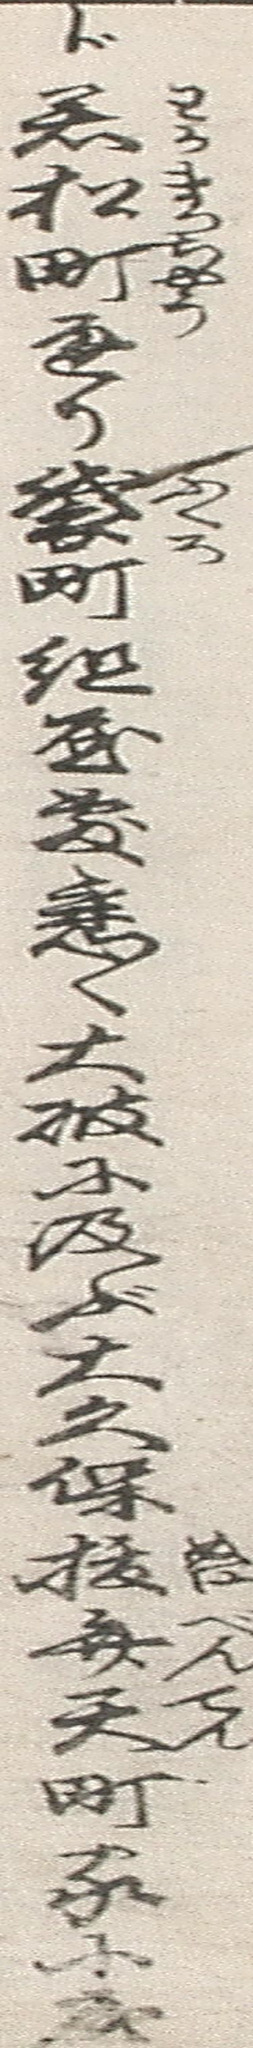じ若松町通り袋町組屋敷悉く大破に及ぶ大久保抜弁天町家小屋
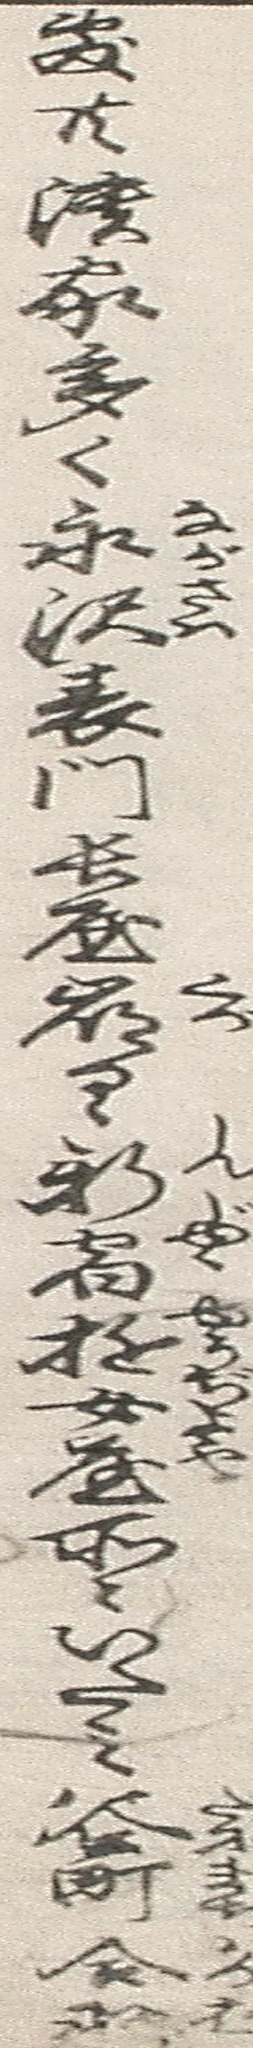敷共潰家多く永沢表門長屋崩るゝ新宿遊女屋所々いたミ谷町合羽
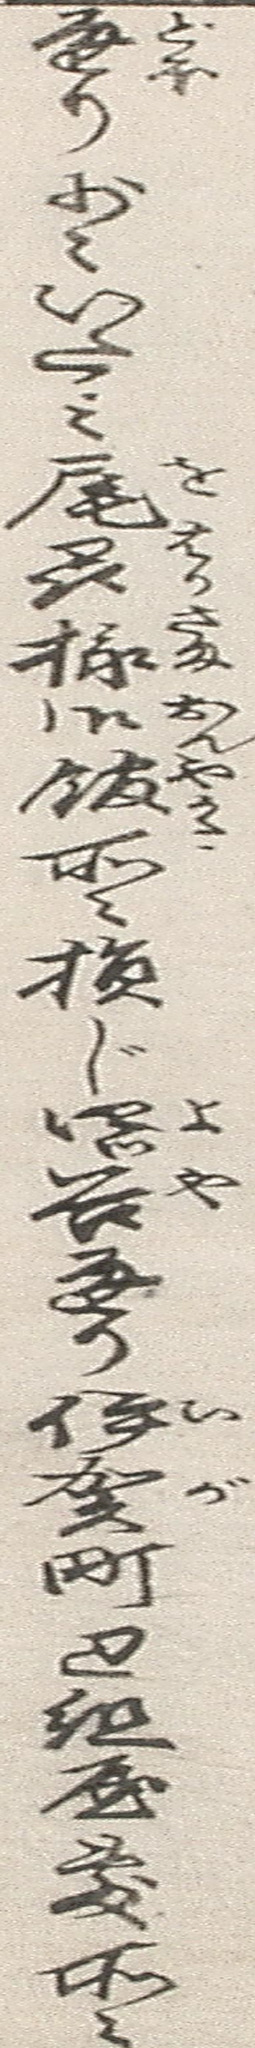通り少々いたミ尾張様御館所々損じ四ツ谷通り伊賀町辺組屋敷所々
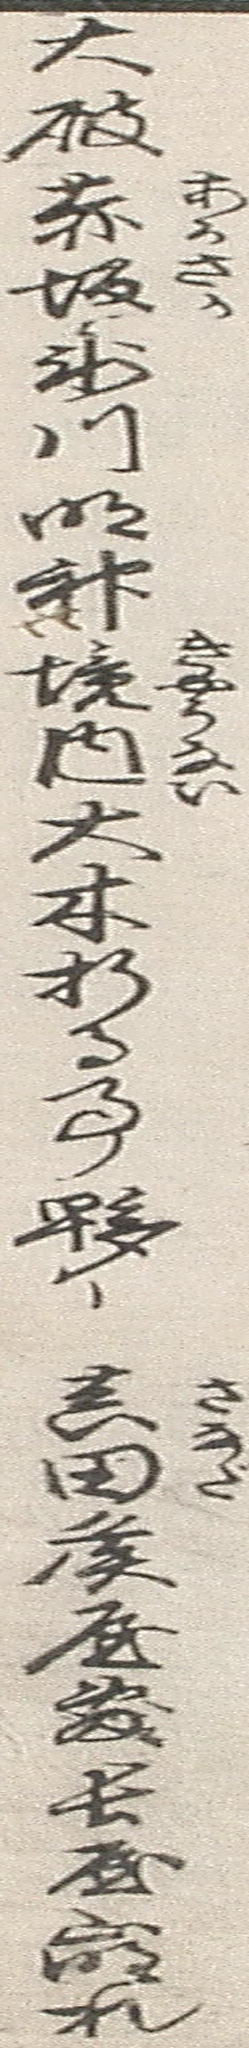大破赤坂氷川明神境内大木折る事夥し真田矦屋敷長屋崩れ
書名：安政風聞集　上中下　全
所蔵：東京大学地震研究所図書室 Earthquake Research Institute Library, The University of Tokyo, JAPAN
